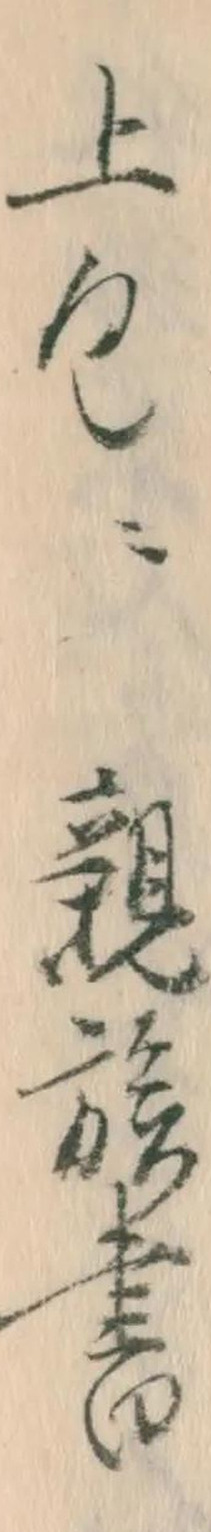上包ニ親族書
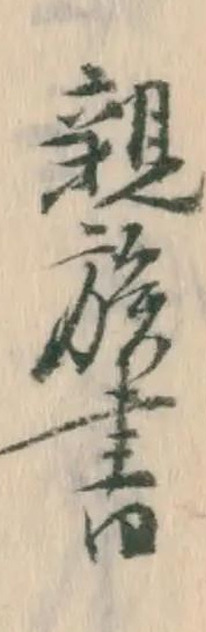親族書
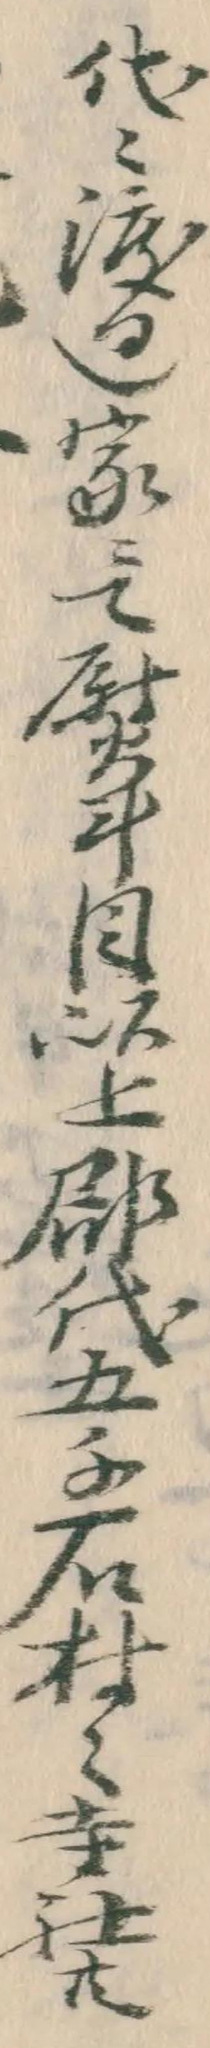代々渡辺家ニて熨斗目以上郡代五千石村々寺社共
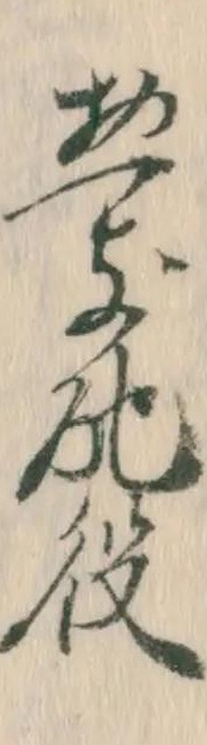惣支配役
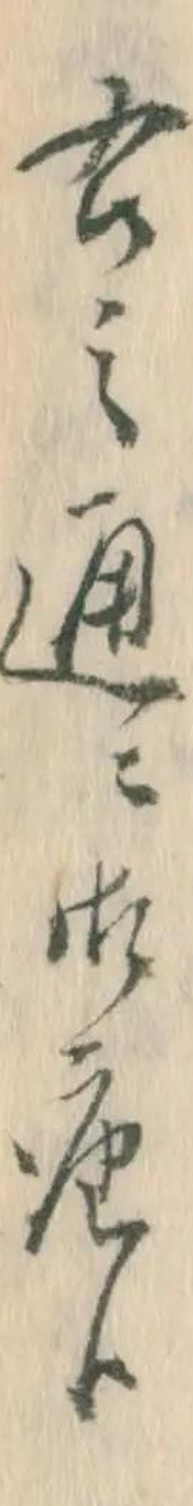右之通ニ御座候

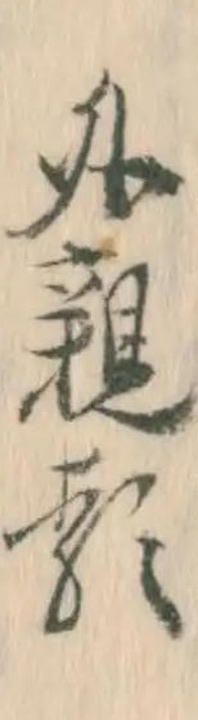外親類
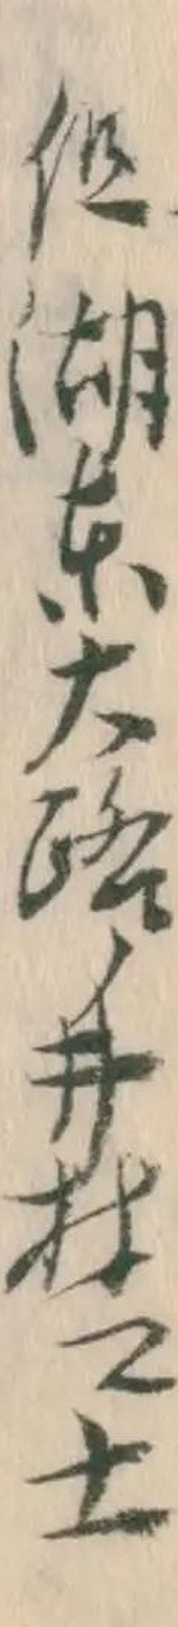但湖東大路ノ井村郷士
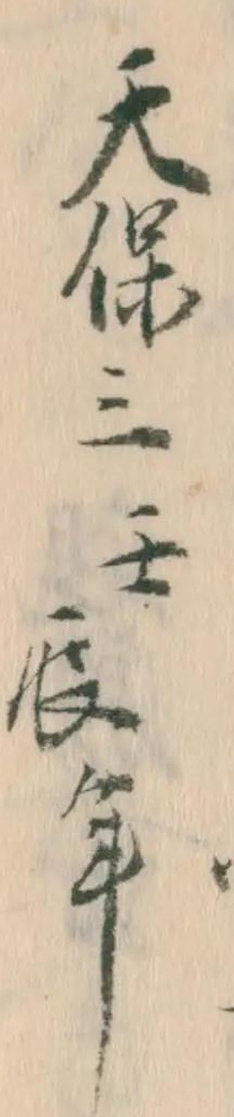天保三壬辰年
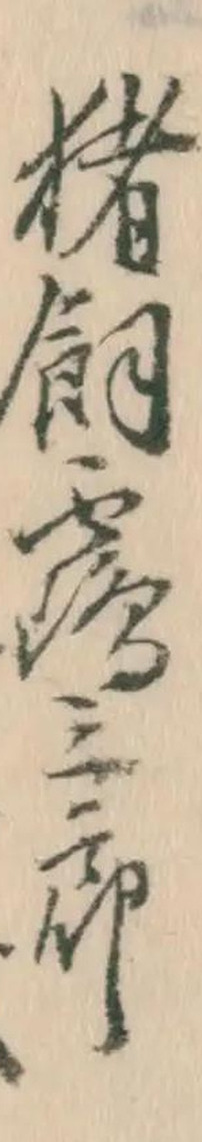猪飼鶴三郎
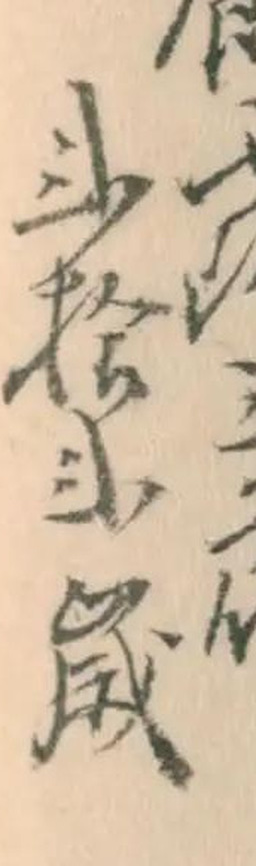弐拾弐歳
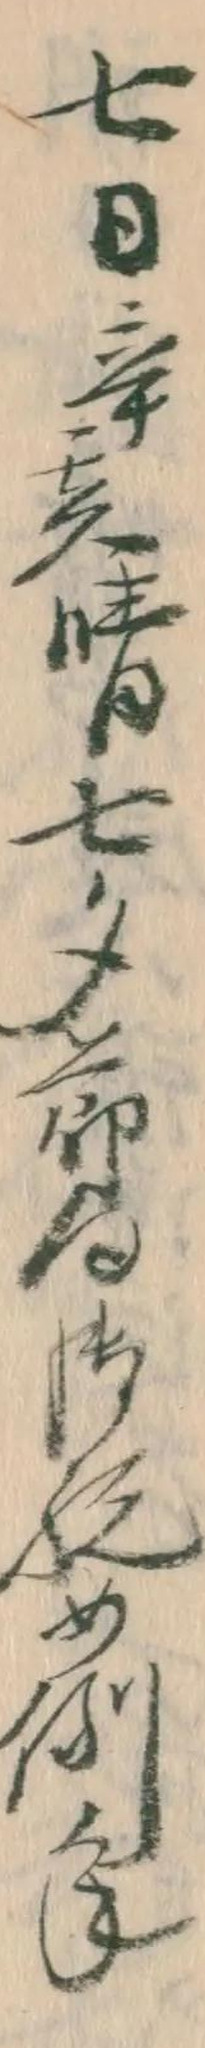七日辛亥晴七夕節句御祝如例年
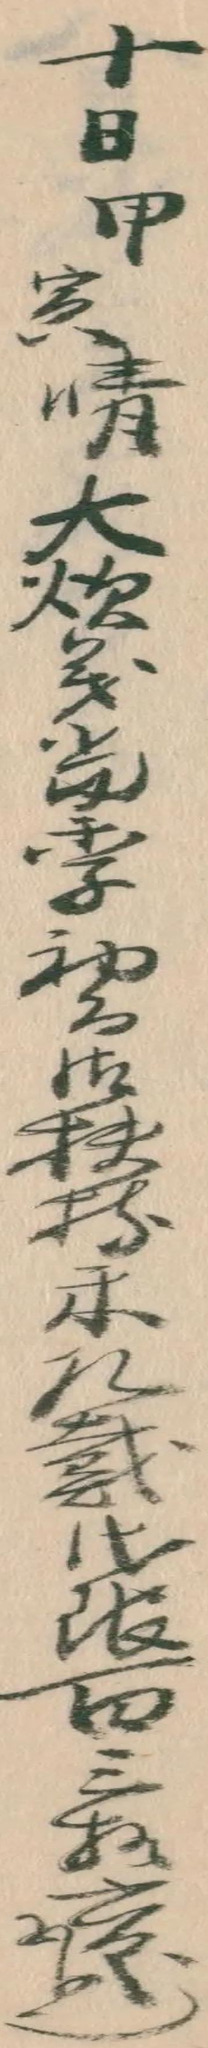十日甲寅晴大炊義當季初而御扶持木札戴代銀百三拾六匁也
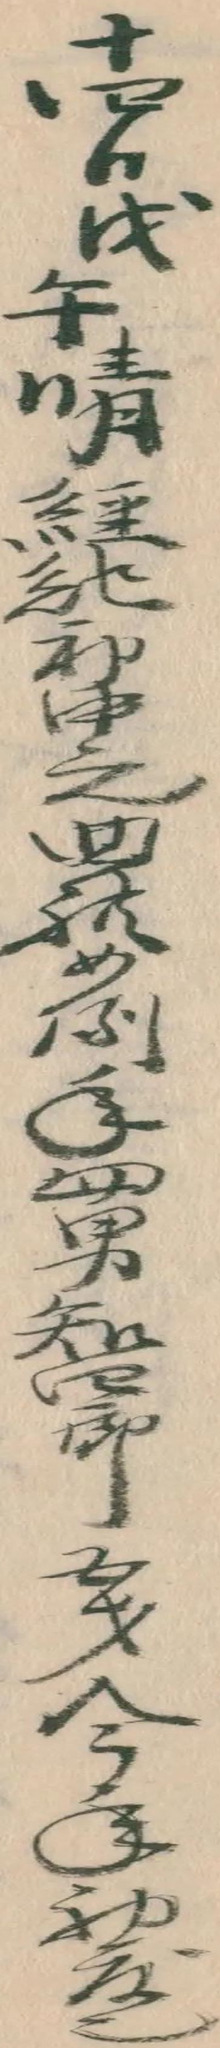十四日戊午晴経紀初中元回礼如例年四男知四郎五才今年初度也
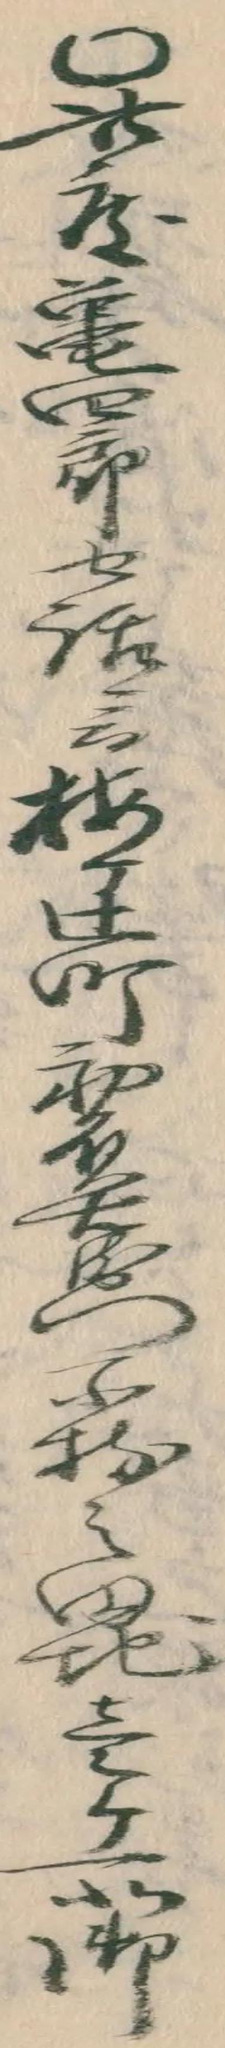◯此度亀四郎世話ニ而梅ヶ辻町初原右衛門所持之田地壱ヶ所御
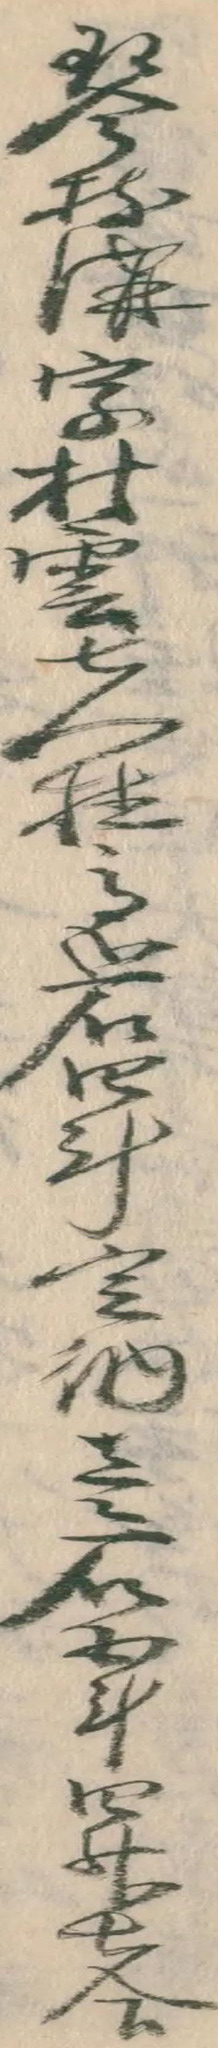今持講字村雲七人植高弐石四斗定納壱石五斗四升七合
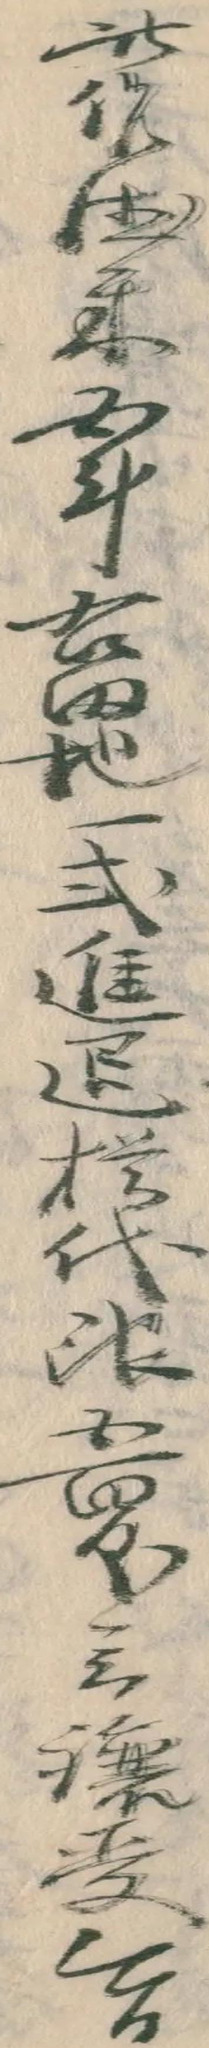此作植米五斗古田地一式進退樽代銀五百匁ニ而譲受今日
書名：賀茂社記録. 第66冊
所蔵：国立国会図書館 National Diet Library, JAPAN
